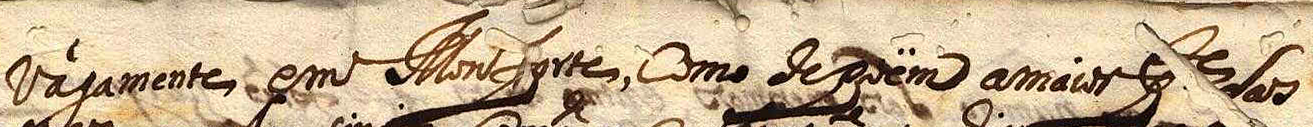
Vágamente em Monforte, Como depoem a maior p.te das
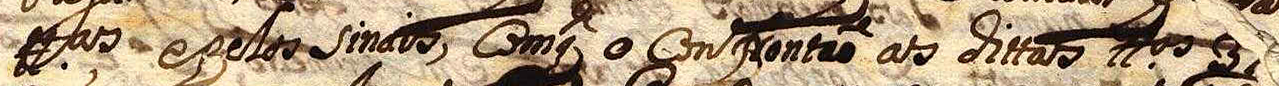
tt.as, e pelos sinais, Com q̄ o Confrontaõ as dittas tt.as 3
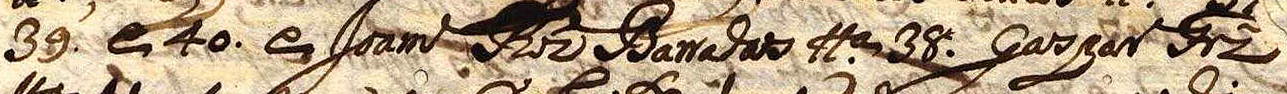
39. e 40. e Joam Roz̄ Barradas tt.a 38. Gaspar Frz̄
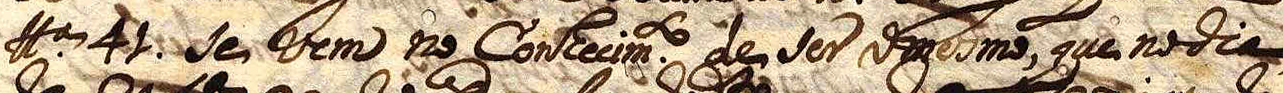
tt.a 41. se vem no Conhecim.to de ser o mesmo, que no dia
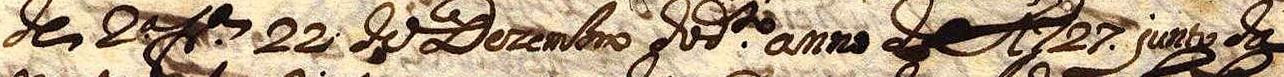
de 2a. fr.a 22 de Dezembro do d.to anno de 1727. junto da
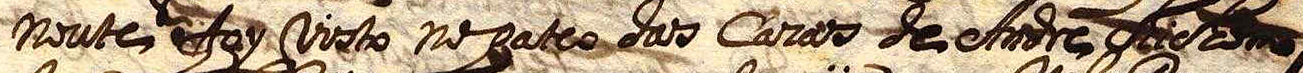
noute foy visto no pateo das Cazas de Andre chichorro
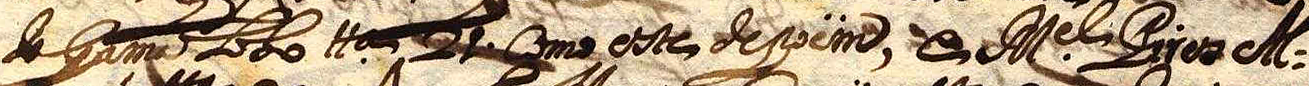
da Gama Lobo tt.a 21. Como este depoem, e M.el Pires Al
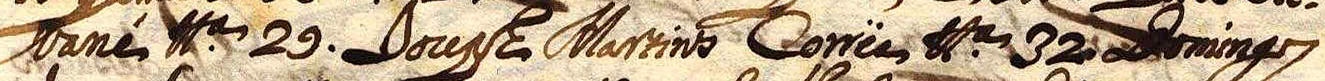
vané tt.a 29. Iozeph Martins Correa, tt.a 32 Domingos
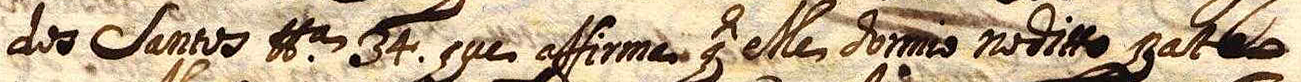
dos Santos tt.a 34. que affirma q̄ elle dormio no ditto pateo
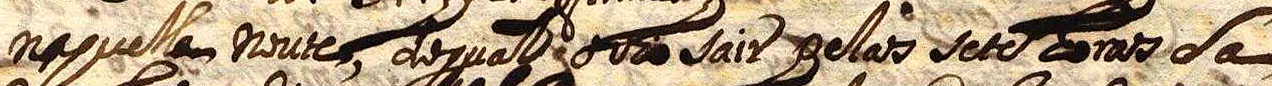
naquella noute, do qual o vio sair pelas sete horas da
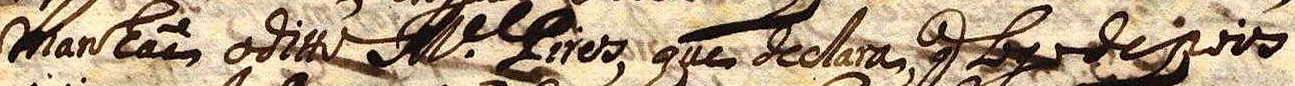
manhaã o ditto M.el Pires, que declara, q̄ logo depois
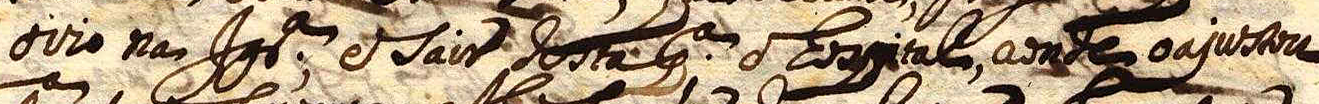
o vio na Jgr.a; e sair desta p.a o hospital, aonde o ajustou
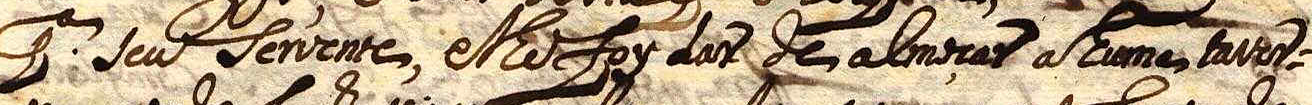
p.a. seu servente, e lhe foy dar de almoçar a huma taver
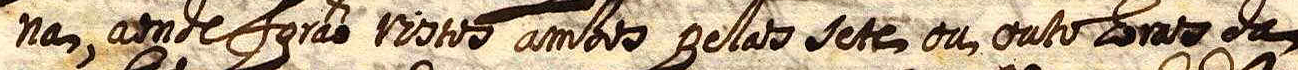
na, aonde forão vistos ambos pelas sete ou outo horas da
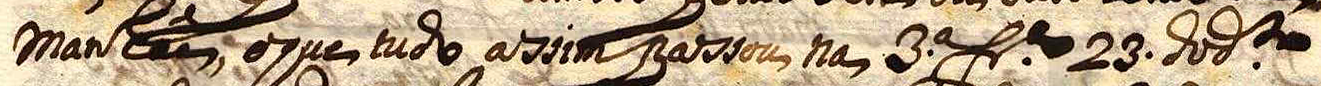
manhaã, e que tudo assim passou na 3.a fr.a 23. do d.to
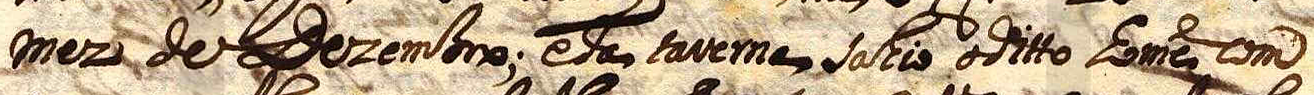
mez de Dezembro; e da taverna sahio o ditto homē com
